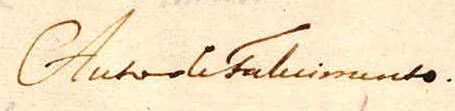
Auto de Falecimento.
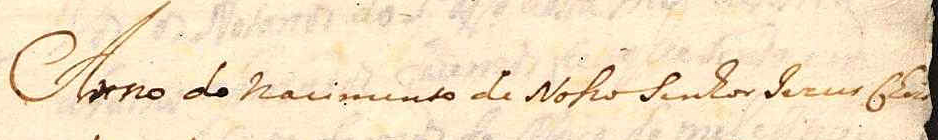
Anno do nacimento de Nosso Senhor Iezus Chri
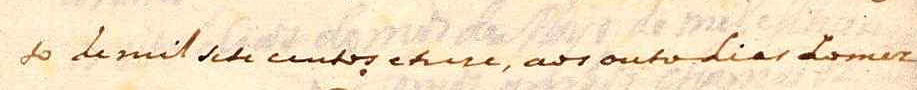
to de mil setecentos e treze, aos outo dias do mez
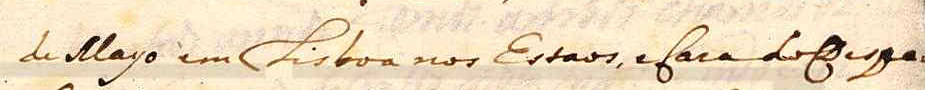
de Mayo em Lisboa nos Estaos, e Caza do Despa
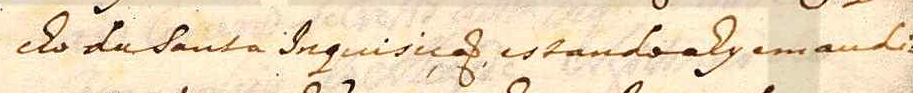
cho da Santa Inquisiçaõ, estando ahy em audi
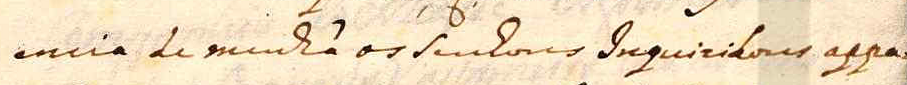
encia de menhã os senhores Inquizidores appa
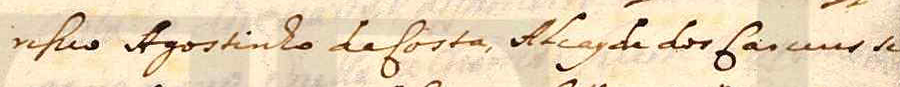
resseo Agostinho da Costa, Alcayde dos Carceres se
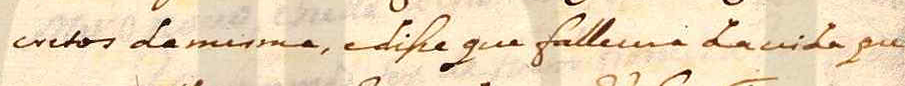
cretos da mesma, e disse que fallecera da uida pre
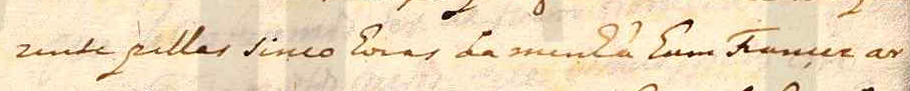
zente pellas sinco horas da menhã hum Françez ar
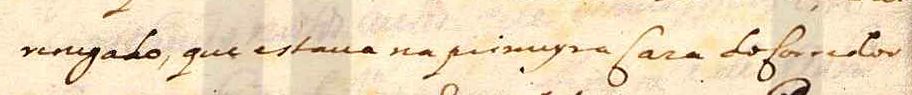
renegado, que estaua na primeyra Caza do Corredor
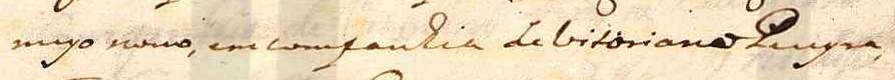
meyo nouo, em companhia de Vitoriano Pereyra,
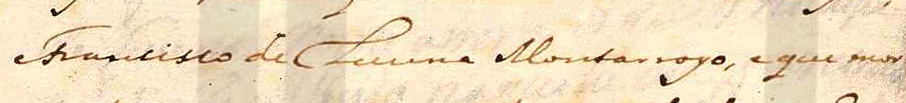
e Francisco de Lucena Montarroyo, e que mor
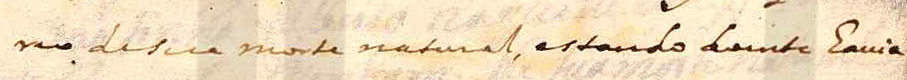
reo de sua morte natural, estando doente hauia
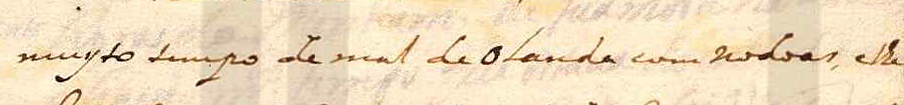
muyto tempo de mal de Olanda com nodoas, e lhe
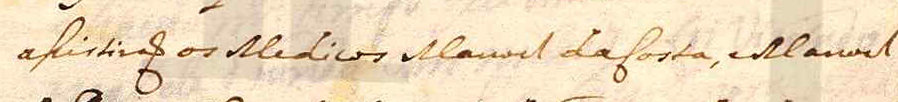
assistiraõ os Medicos Manoel da Costa, e Manoel
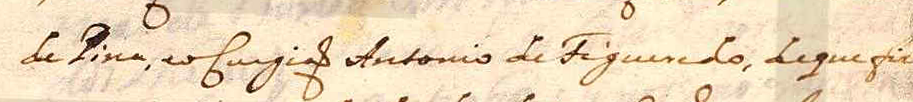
de Pina, e o Curgiaõ Antonio de Figueredo, de que fiz
